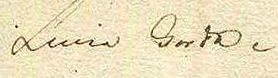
Luiza Gorda e
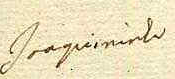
Joaquininha
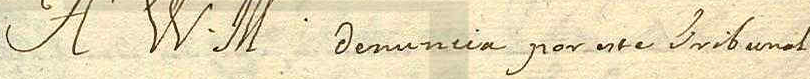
A VV. Ill.mas denuncia por este Tribunal
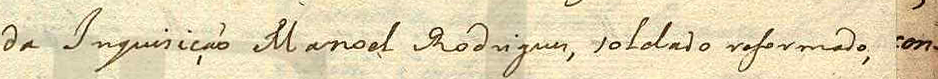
da Inquisiçaõ Manoel Rodrigues, soLdado reformado,
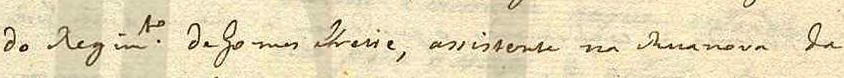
do Regim.to de Gomes Freire, assistente na Rua nova da
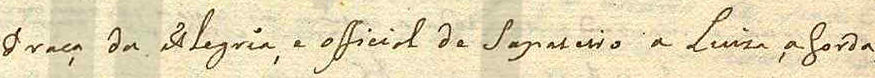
Praça da Alegria, e officiaL de Sapateiro a Luiza, a Gorda,
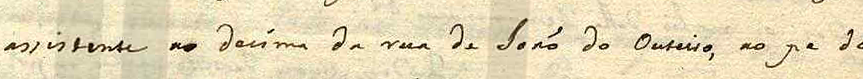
assistente ao decimo da rua de Ioaõ do Outeiro, ao pe do
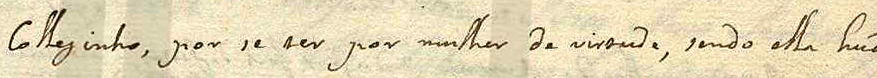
Colleginho, por se ser por mulher de virtude, sendo ella hūa
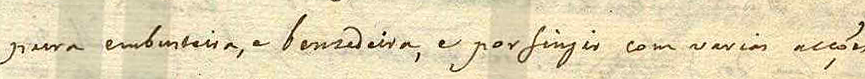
pura embusteira, e benzedeira, e por fingir com varias acções
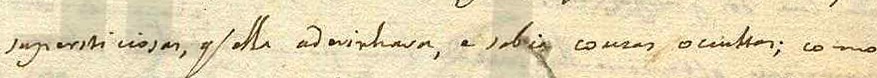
supersticiosas, q̄ ella adevinhava, e sabia couzas occultas; como
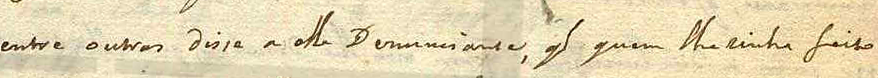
entre outras disse a elle Denunciante, q̄ quem lhe tinha feito
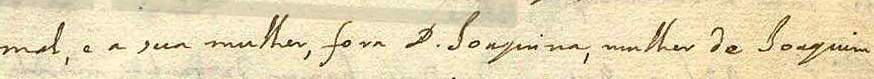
mal, e a sua mulher, fora D. Ioaquina, mulher de Ioaquim
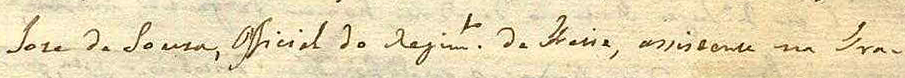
Ioze de Souza, Official do Regim.to de Freire, assistente na Tra
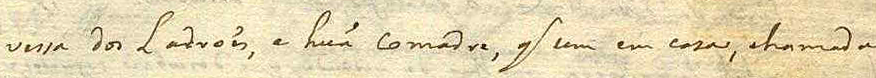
versa dos Ladroẽs, e huā comadre, q̄ tem em caza, chamada
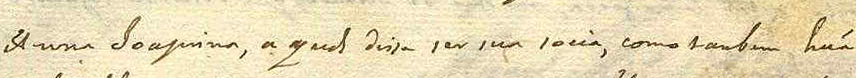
Anna Ioaquina, a qual disse ser sua socia, como tambem huā
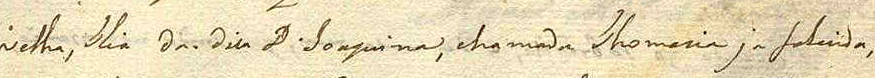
velha, Thia da dita D. Ioaquina, chamada Thomazia ja faLecida,
